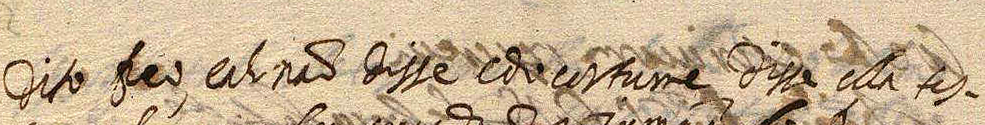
dito Reo, e al naõ disse e do costume disse ella tes
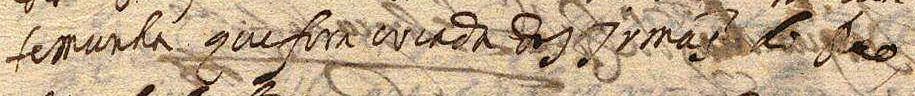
temunha que fora criada dos jrmaõs do Reo
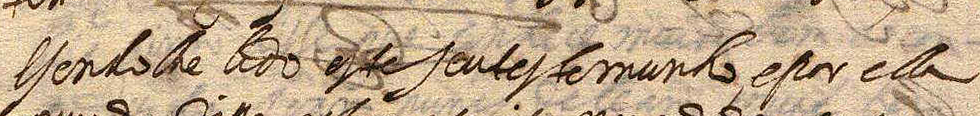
E sendolhe lido este seu testemunho, e por ella
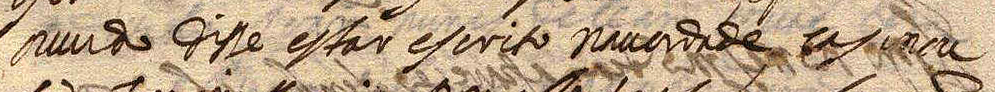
ouuido disse estar escrito na uerdade e asinou
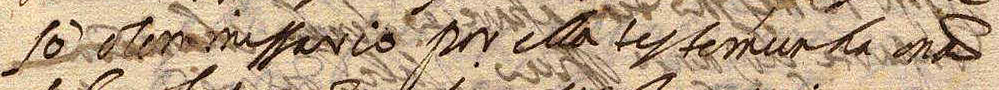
só o commissario por ella testemunha o não
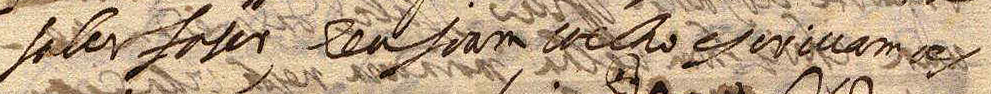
saber fazer, E eu joam coelho escriuam o es
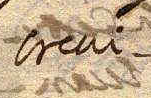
creui
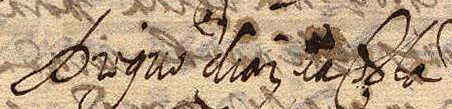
Dioguo diaz da Costa
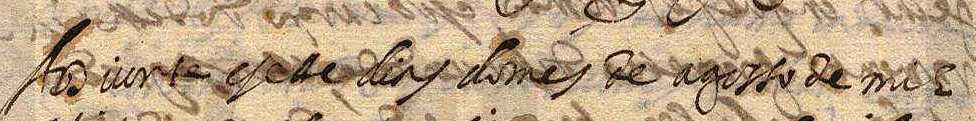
Aos uinte e sette dias do mes de agosto de mil
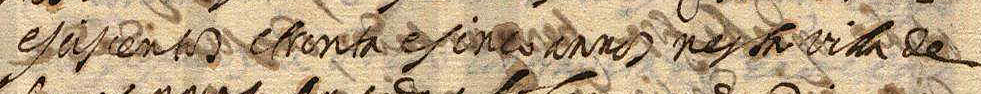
e seiscentos e trinta e sinco annos nesta villa de
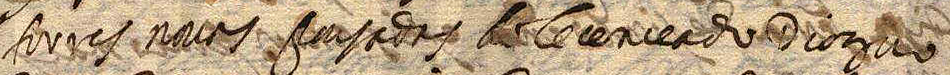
torres nouas pousadas do lecenceado dioguo
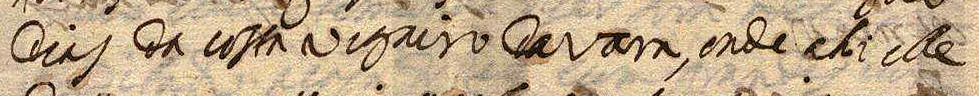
dias da costa vigairo da vara, onde ahi elle
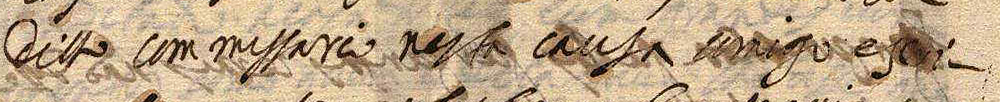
ditto commissario nesta causa comigo escri
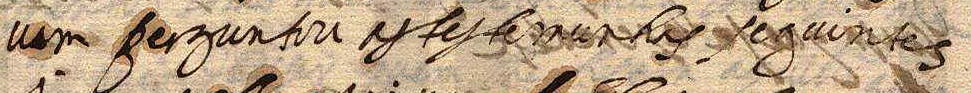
uam perguntou as testemunhas seguintes
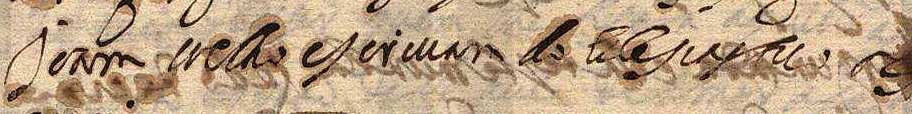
Joam coelho escriuam do Eclesiastico o es
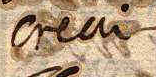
creui
